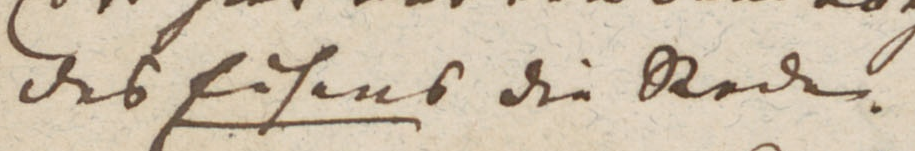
des Eisens die Rede.
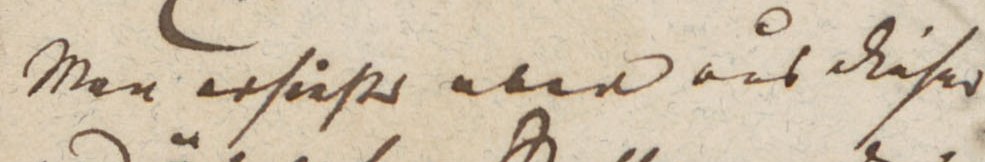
Man ersieht aber aus dieser
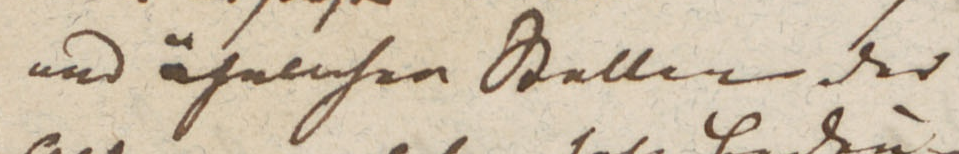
und ähnlichen Stellen der
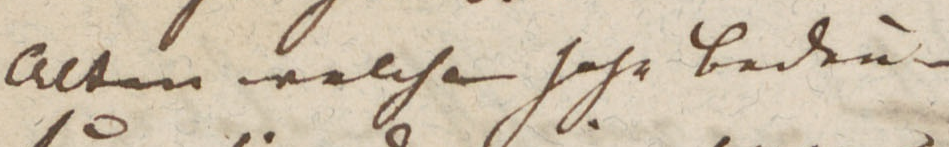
Alten welche hohe Bedeu-
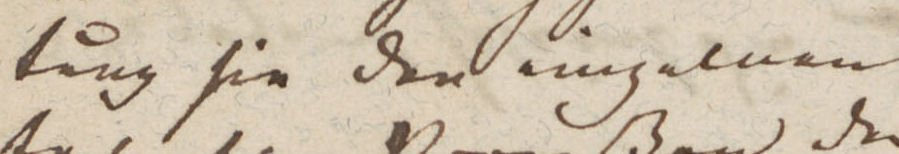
tung sie den einzelnen
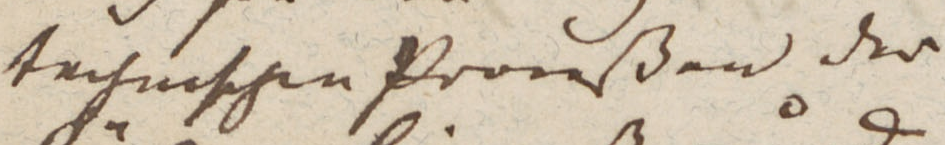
technischen Processen der
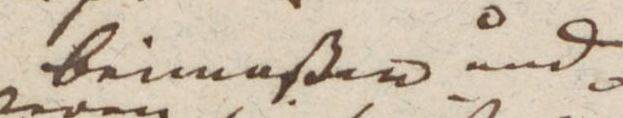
beimassen und
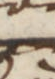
biegen
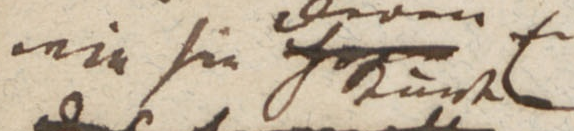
die in der deren
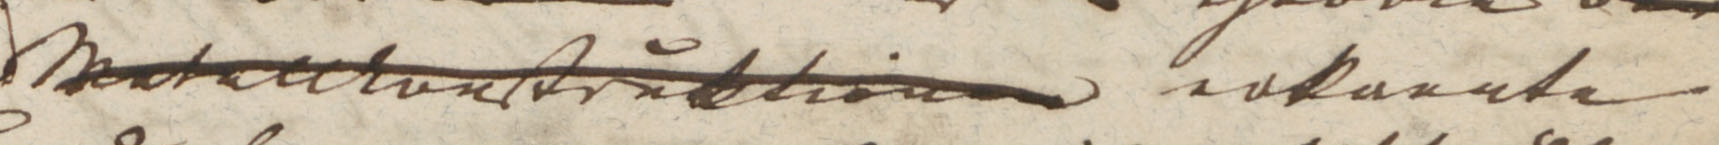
Metallkonstruktionen erkannte
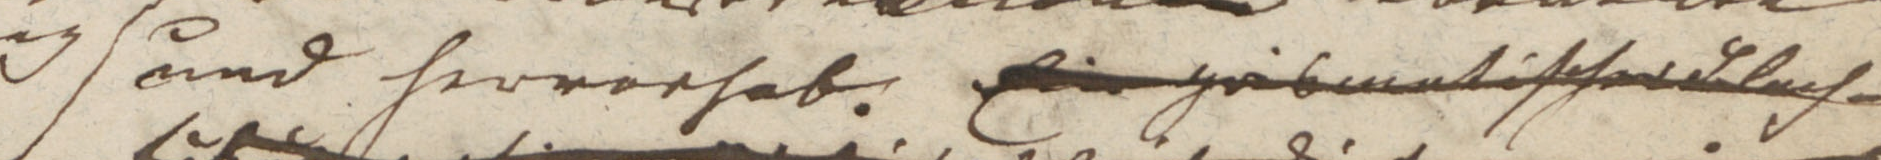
und hervorhob. Ein prismatischer Blech-
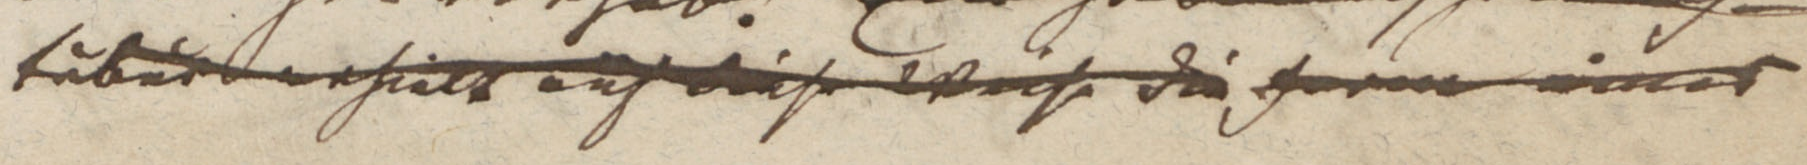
tubr erhielt auf diese Weisse die Form eines
